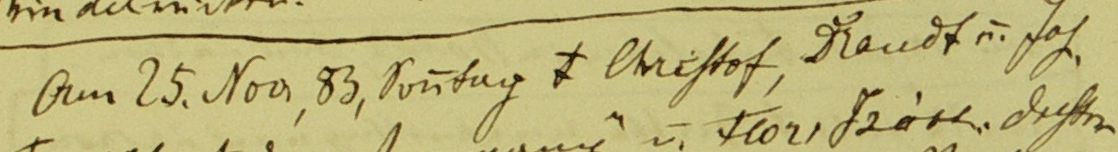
Am 25. Nov, 83, Sonntag, mit Christof, Draudt und Josef
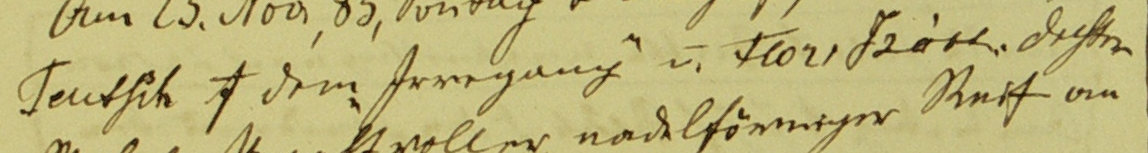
Teutsch auf dem “Irregang“ und Flori Szasz. Dichter
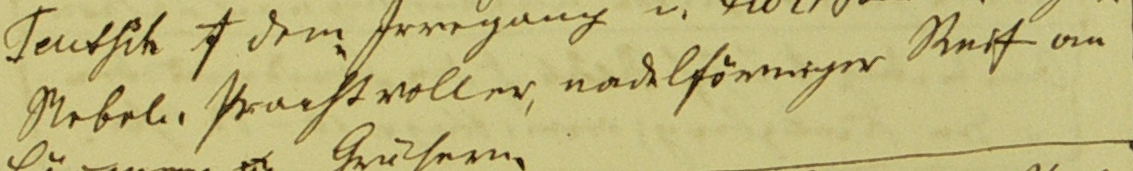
Nebel. Prachtvoller, nadelförmiger Reif an
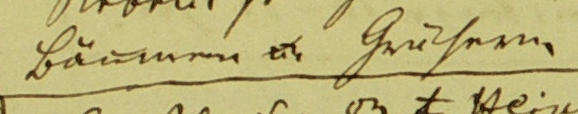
Bäumen und Gräsern.
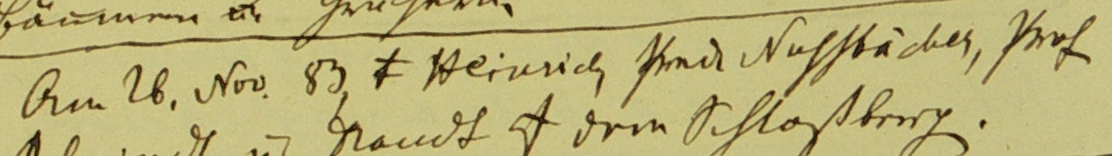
Am 26. Nov. 83, mit Heinrich, Pred. Nussbächer , Prof.
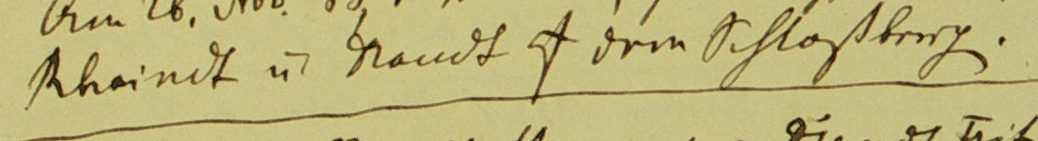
Rheindt und Draudt auf dem Schlossberg.
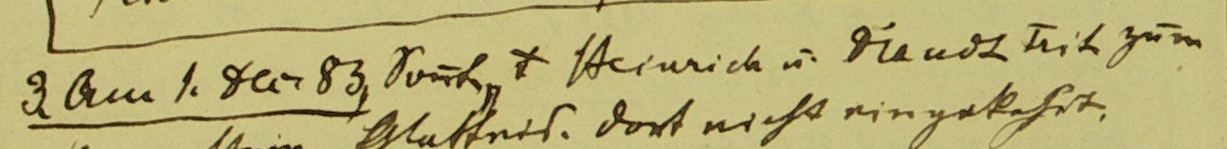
3. Am 1. Dez. 83, Sonntag mit Heinrich und Draudt Fritz zum
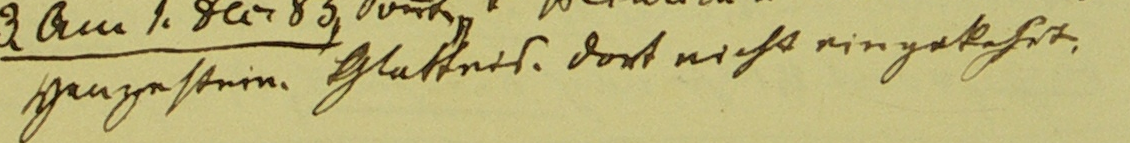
Hangestein. Glatteis. Dort nicht eingekehrt.
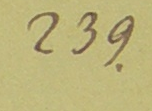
239
